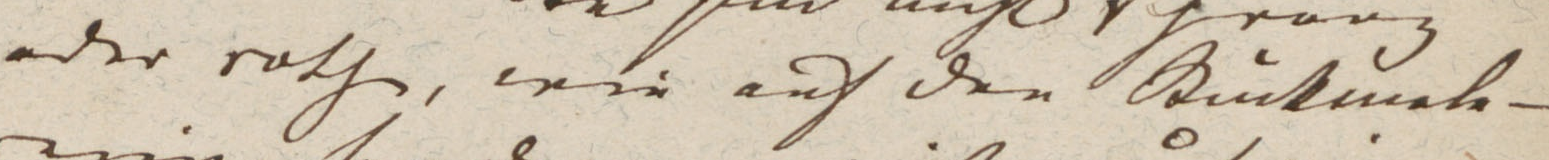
oder roth, wie auf den Stuckmale-
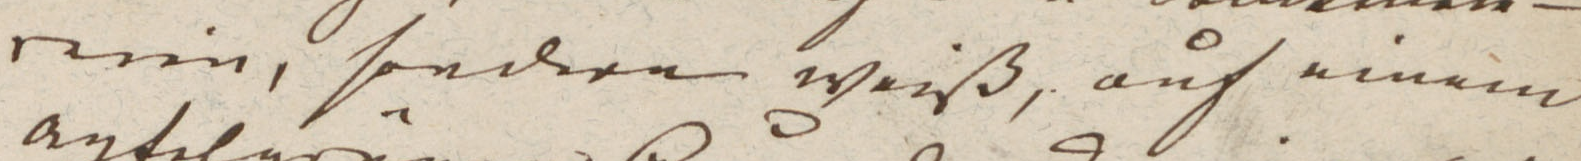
reien, sondern weiss, auf einem
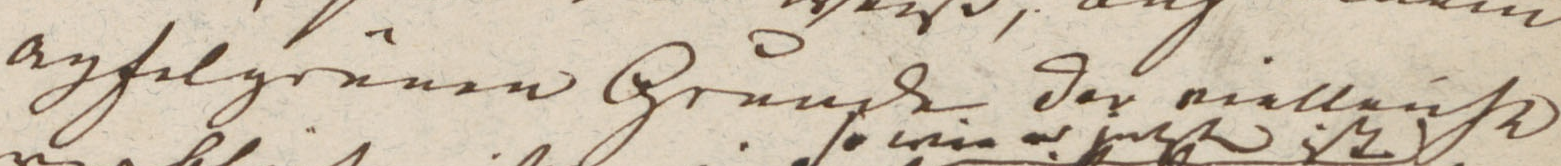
apfelgrünen Grunde der vielleicht
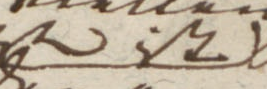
ist mit den anderen
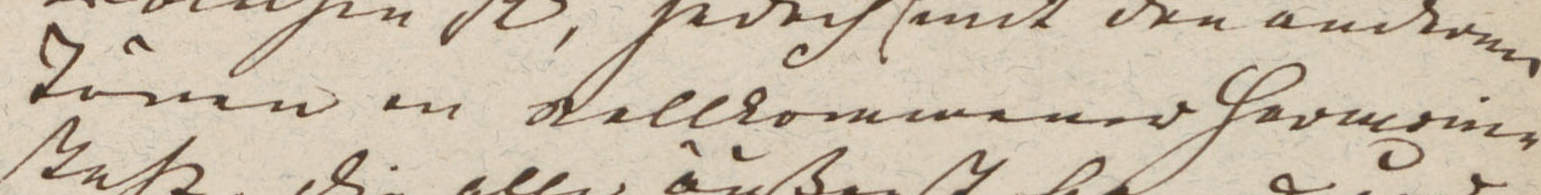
Tönen in vollkommener Harmonie
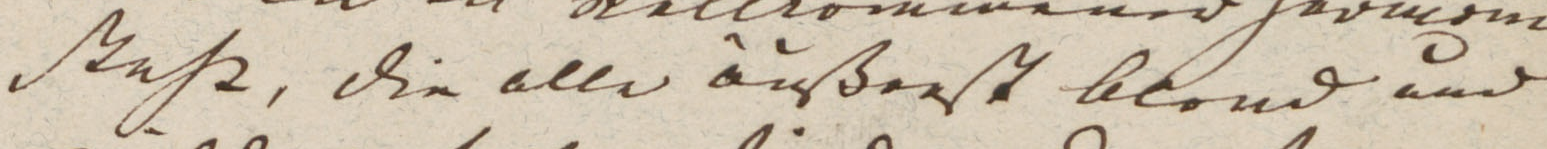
steht, die alle äusserst blond und
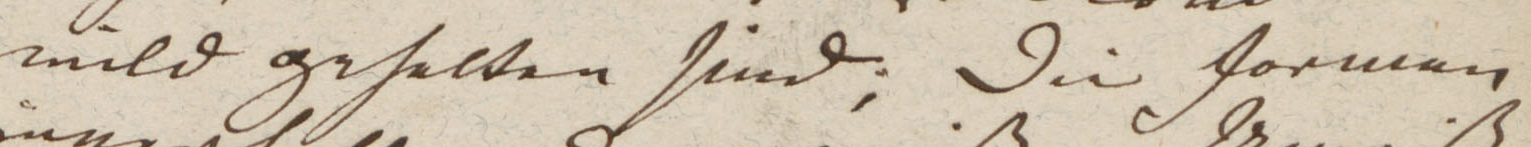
mild gehalten sind; Die Formen
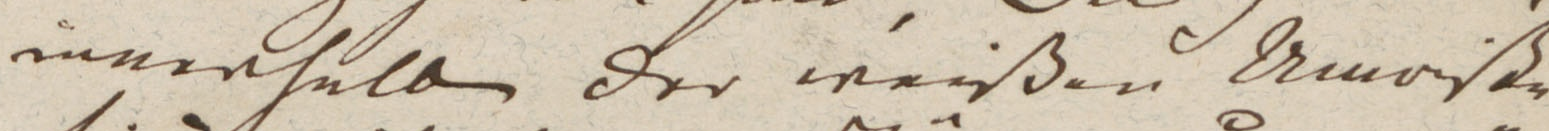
innerhalb der weissen Umrisse
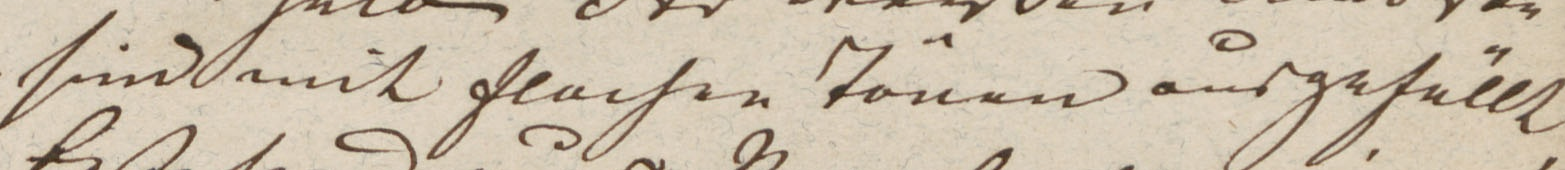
sind mit flachen Tönen ausgefüllt,
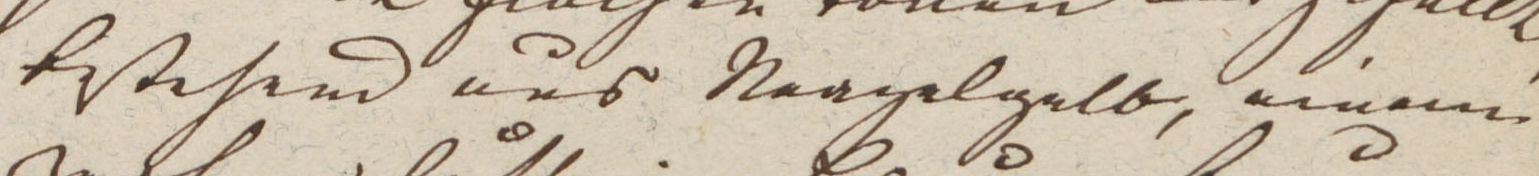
bestehend aus Neapelgelb, einem
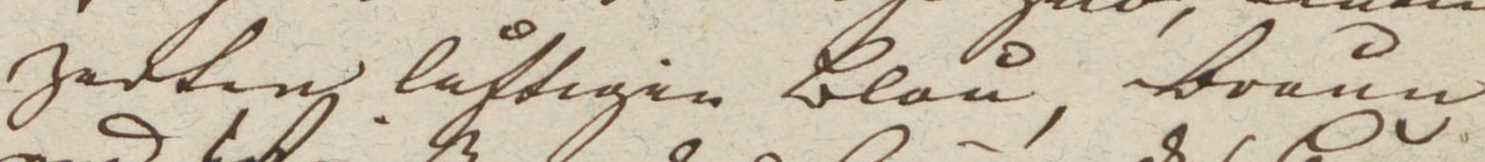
zarten luftigen Blau, Braun
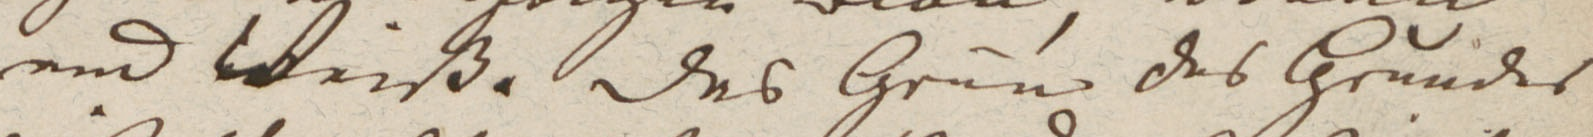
und wWeiss. Das Grün des Grundes
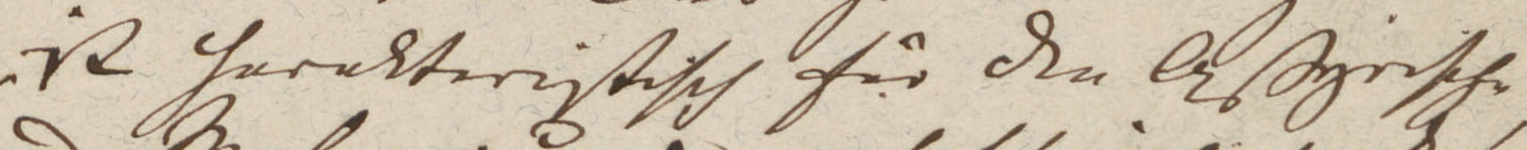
ist charakteristisch für die Assyrische
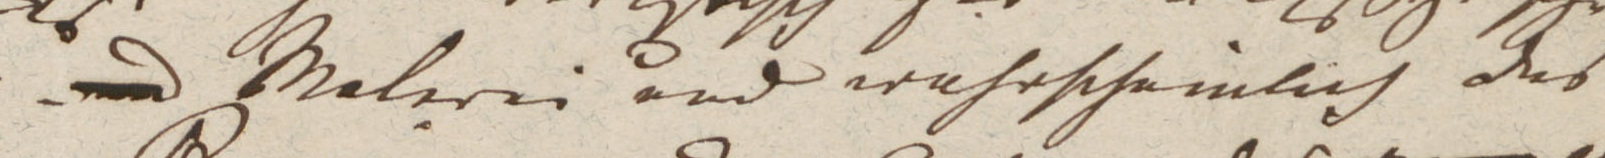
und Malerei und wahrscheinlich das
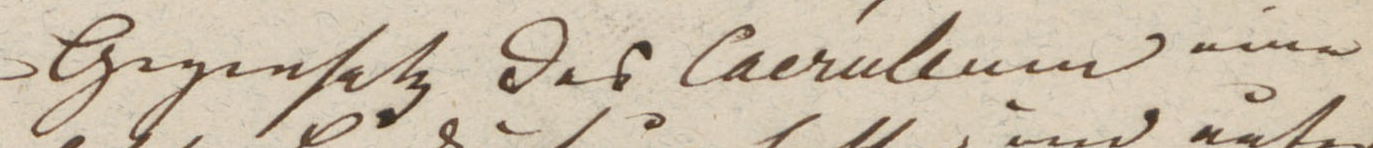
Gegensatz des Caeruleum eine
